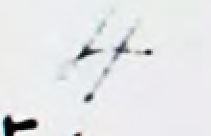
4
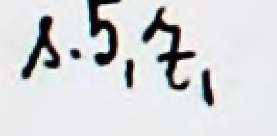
s. 5, 7
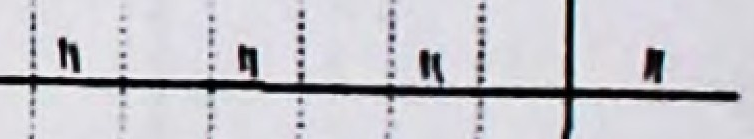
„ „ „ „
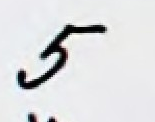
5
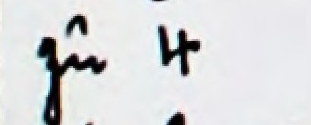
zu 4
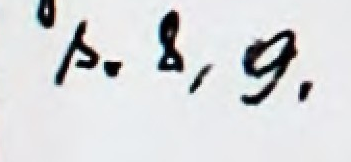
s. 8, 9.
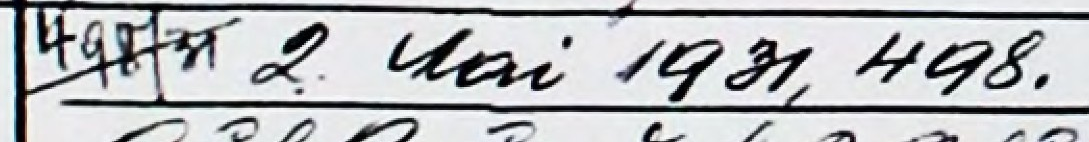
498/31 2. Mai 1931, 498.
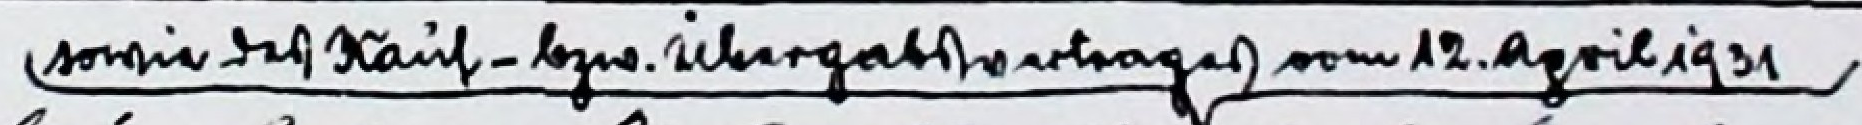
sowie des Kauf- bzw. Übergabsvertrages vom 12. April 1931
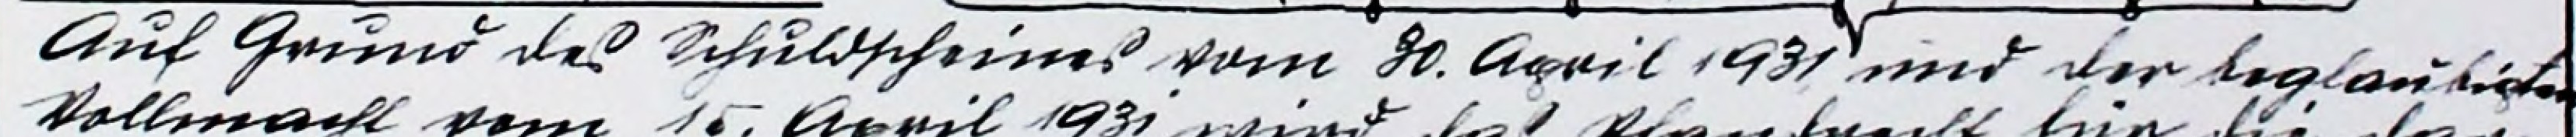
Auf Grund des Schuldscheines vom 30. April 1931 und der beglaubigten
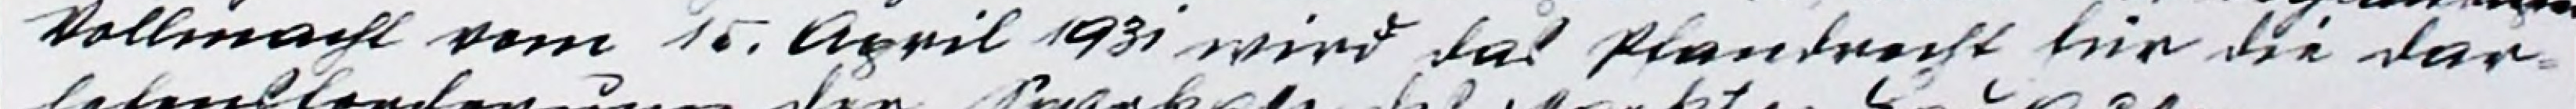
Vollmacht vom 15. April 1931 wird das Pfandrecht für die Dar„
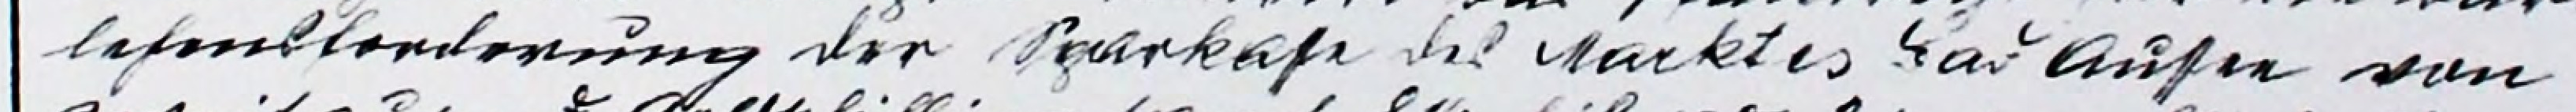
lehensforderung der Sparkasse des Marktes Bad Aussee von
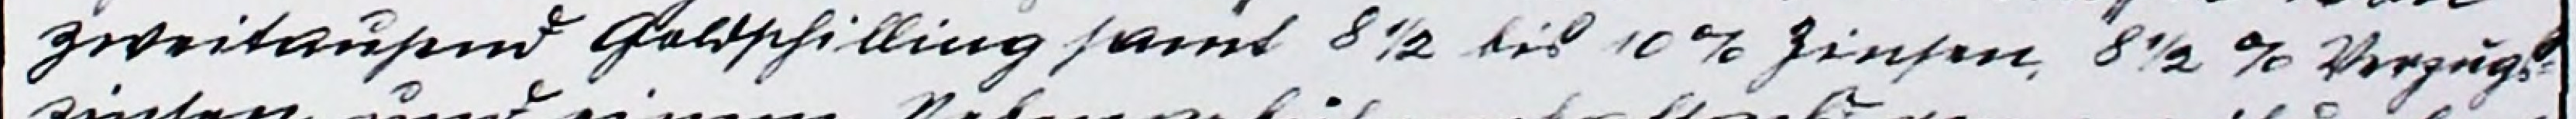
zweitausend Goldschilling samt 8 1/2 bis 10 % Zinsen, 8 1/2 % Verzugs=
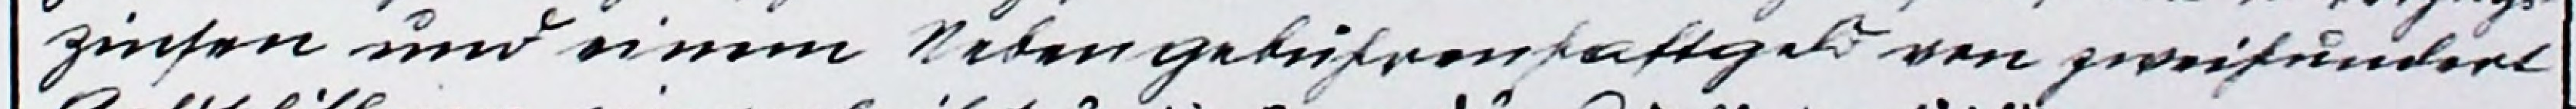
zinsen und einem Nebengebührenhaftgeld von zweihundert
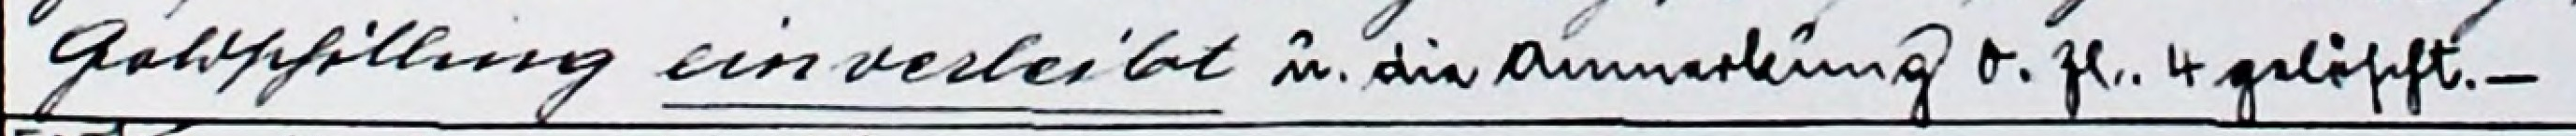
Goldschilling einverleibt u. die Anmerkung v. Zl. 4 gelöscht.-
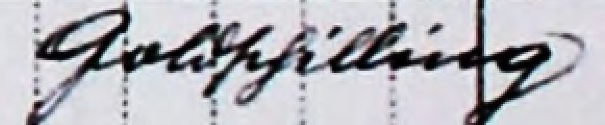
Goldschilling
